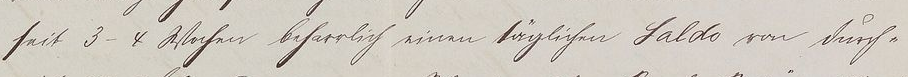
seit 3–4 Wochen beharrlich einen täglichen Saldo von durch-
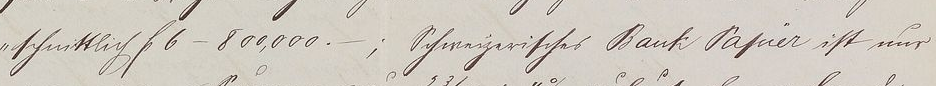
schnittlich f 6–800,000.–; Schweizerisches Bank Papier ist nur
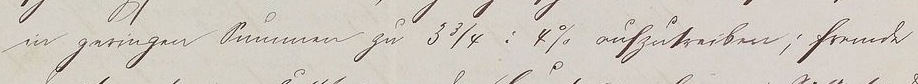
in geringer Summe zu 3¾:4% aufzutreiben; fremde
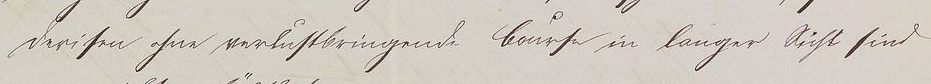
Devisen ohne verlustbringende Course in langer Sicht sind
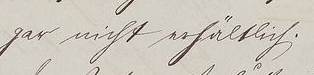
gar nicht erhältlich.
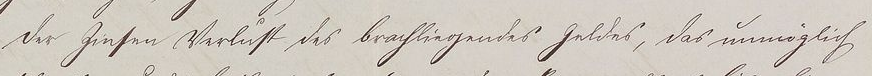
Der Zinsen Verlust des brachliegendes Geldes, das unmöglich
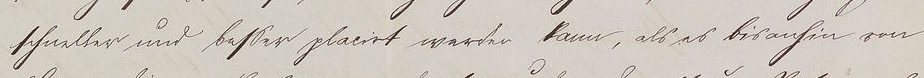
schneller und beßer placirt werden kann, als es bisanhin von
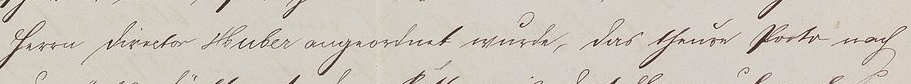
Herrn Director Huber angeordnet wurde, das theure Porto nach
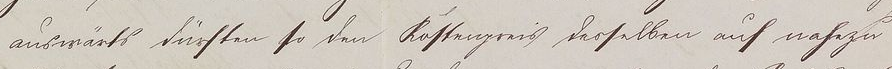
auswärts dürften so den Kostenzins desselben auf nahezu
